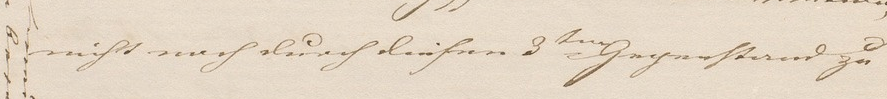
nicht noch durch diesen 3ten Gegenstand zu
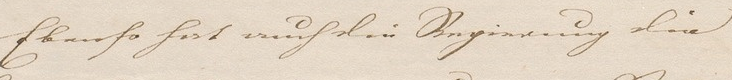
Ebenso hat auch die Regierung die
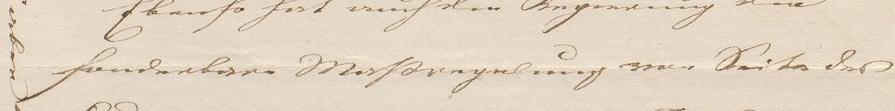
sonderbare Maßregelung Seite des
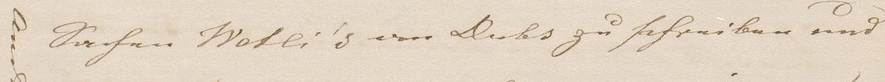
Sachen Wetli's an Dubs zu schreiben und
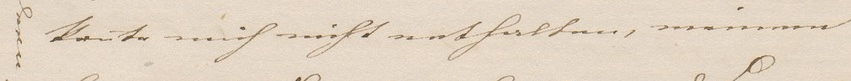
konnte mich nicht enthalten, meinem
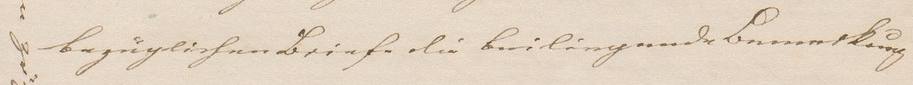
bezüglichen Briefe die beiliegende Bemerkung
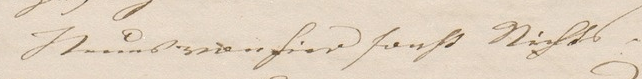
Neues von hier sonst Nichts.
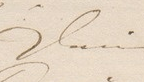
Dein
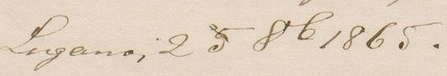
Lugano, 25 8b 1865.
